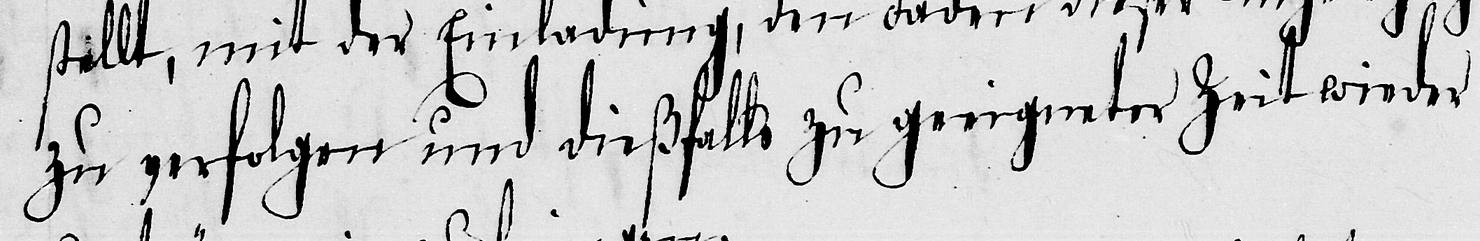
zu verfolgen und dießfalls zu geeigneter Zeit wieder
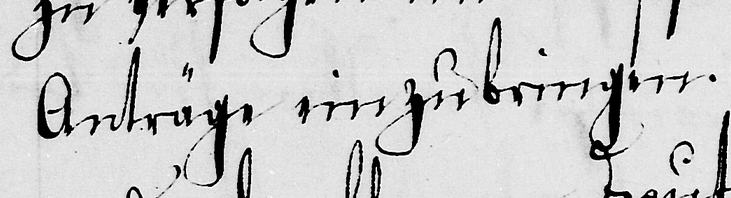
Anträge einzubringen.
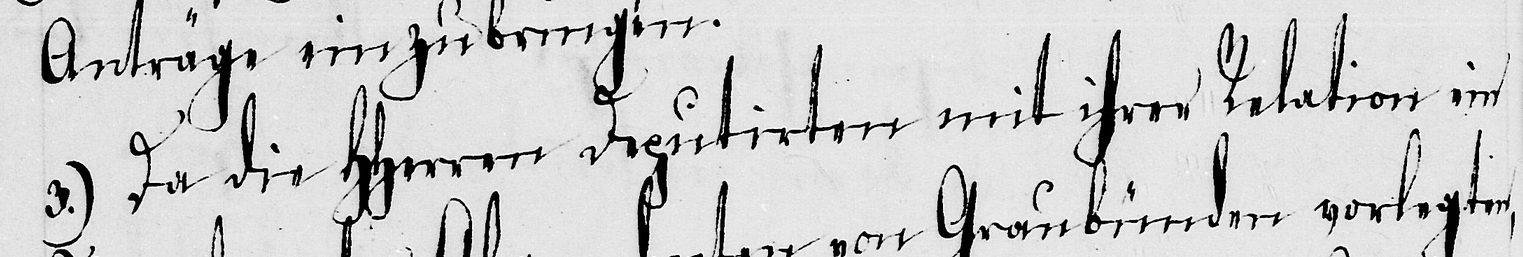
3.) Da die HHerren Deputirten mit ihrer Relation ein
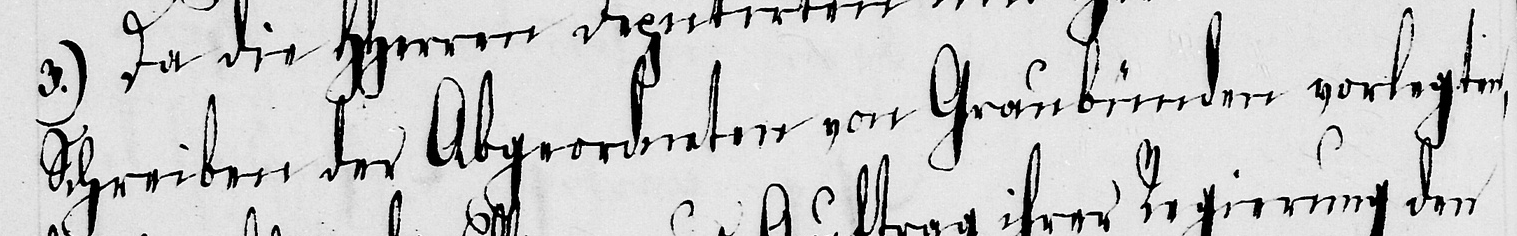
Schreiben der Abgeordneten von Graubünden vorlegt¬
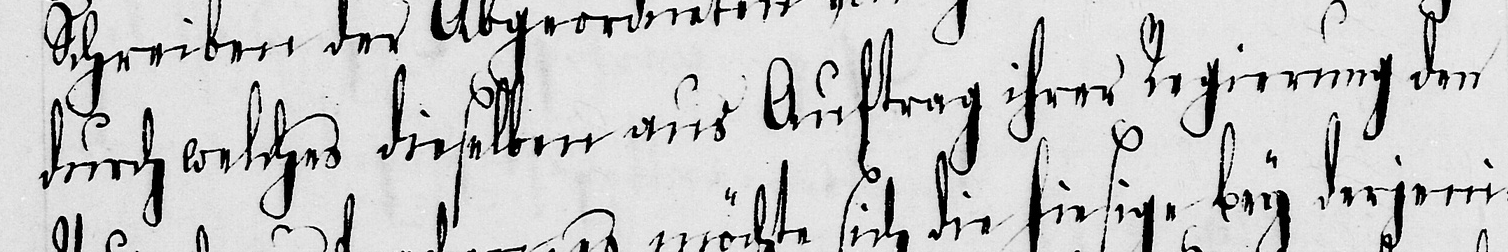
durch welches dieselben aus Auftrag ihrer Regierung den
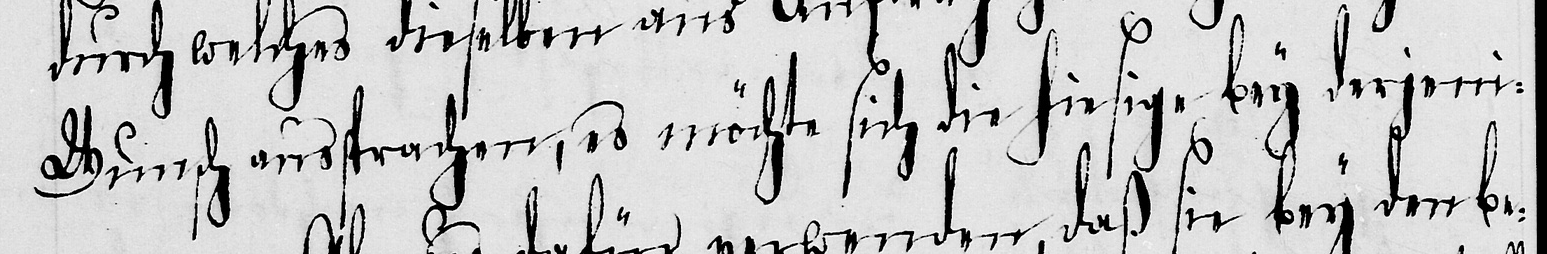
Wunsch aussprachen, es möchte sich die hiesige bey derjeni¬
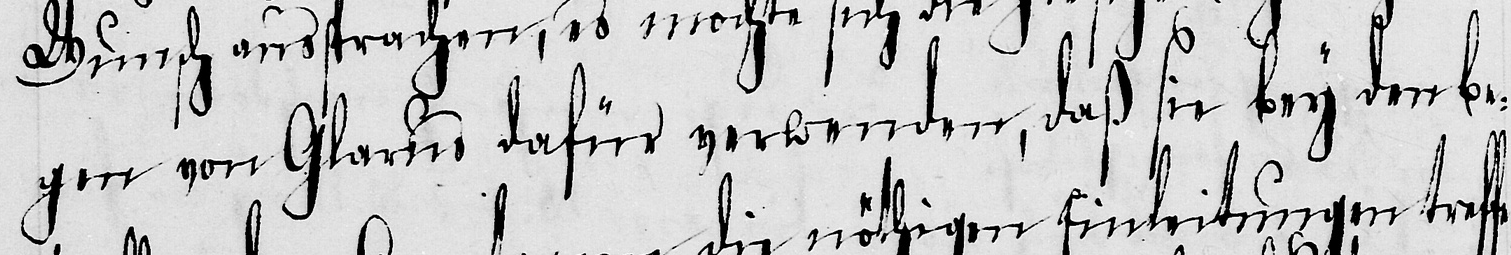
gen von Glarus dafür verwenden, daß sie bey den b¬
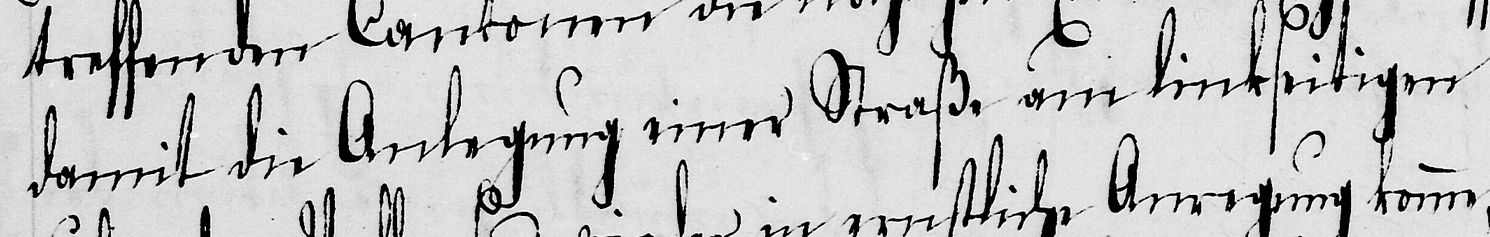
damit die Anlegung einer Straße am linkseitigen
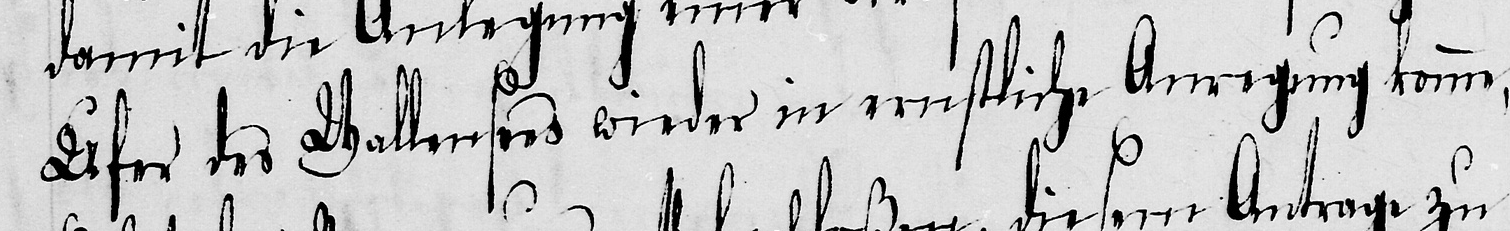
Ufer des Wallensees wieder in ernstliche Anregung kom¬
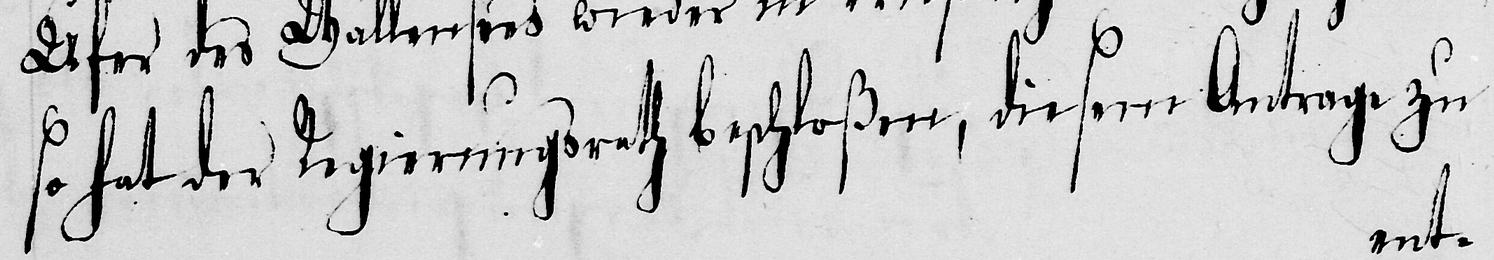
so hat der Regierungsrath beschloßen, diesem Antrag zu
